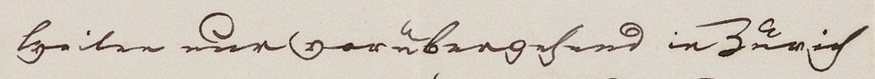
weilen nur vorübergehend in Zürich
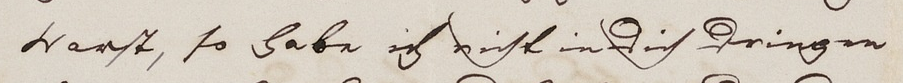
warst, so habe ich nicht in Dich dringen
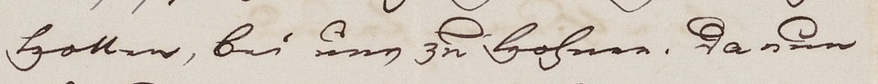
wollen, bei uns zu wohnen. Da nun
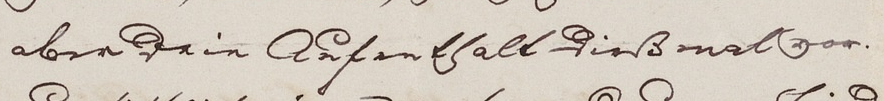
aber Dein Aufenthalt dießmal vor-
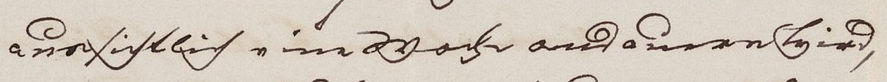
aussichtlich eine Woche andauern wird,
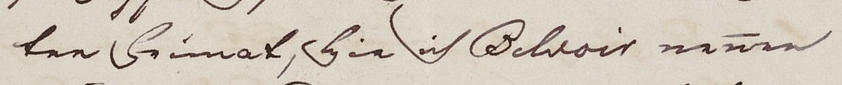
te Heimat, wie ich Belvoir nennen
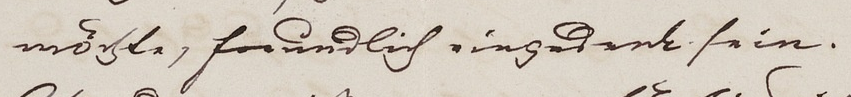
möchte, freundlich eingedenk sein.
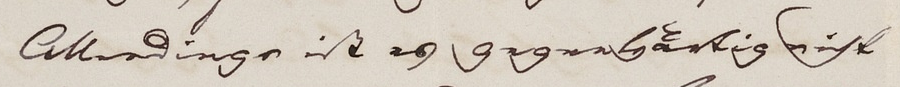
Allerdings ist es gegenwärtig nicht
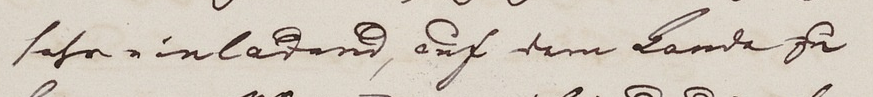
sehr einladend, auf dem Lande zu
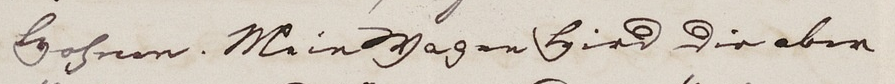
wohnen. Mein Wagen wird Dir aber
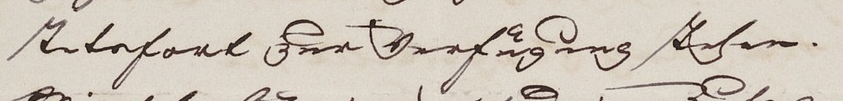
stetsfort zur Verfügung stehen.
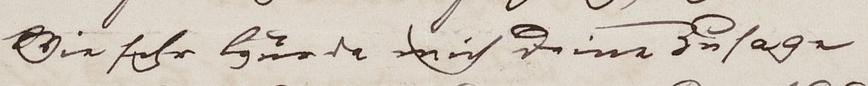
Wie sehr würde mich Deine Zusage
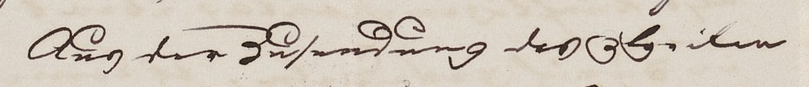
Aus der Zusendung des zweiten
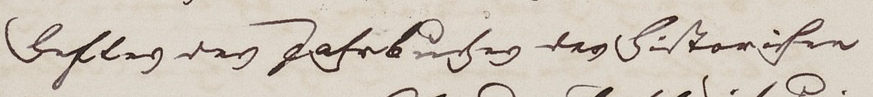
Heftes des Jahrbuches des Historischen
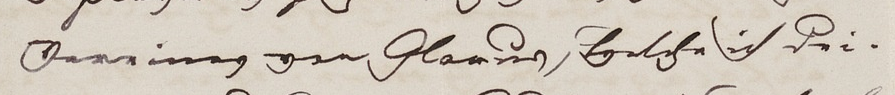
Vereines von Glarus, welche ich Dei-
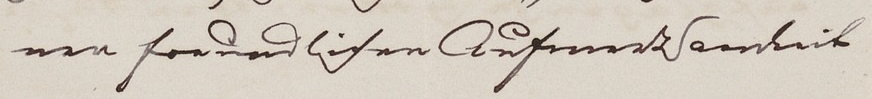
ner freundlichen Aufmerksamkeit
